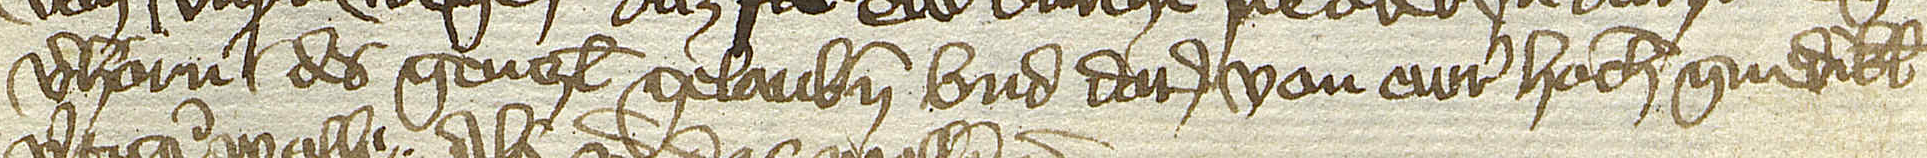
v*hörn / des gencʒl* gelaub*n vnd dar* von ew*r hoch* gnedikl*
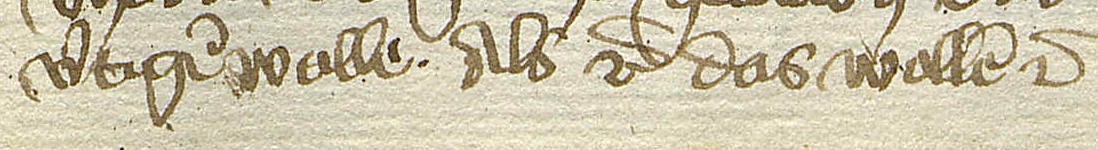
v*tige* welle* . Als ec* das wolle* ec*
